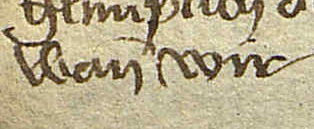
wan* wir
